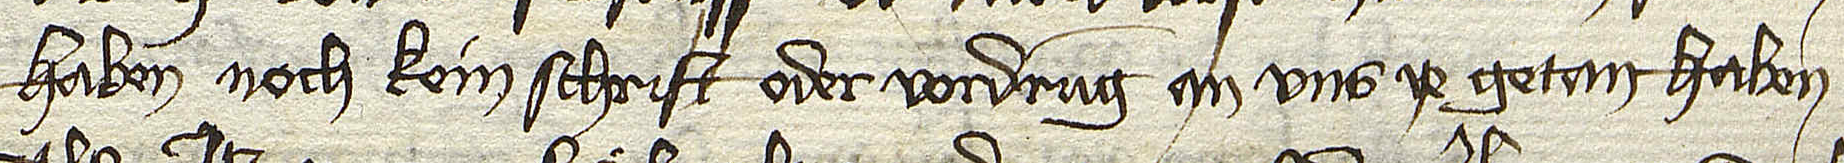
haben noch kein ſchrift oder vordrug* an vns ye getan haben
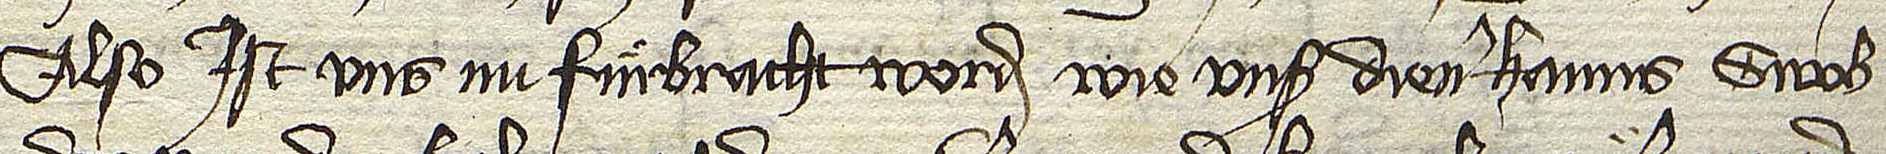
Alſo Iſt vns nu fürbracht word* wie vnſ* dien* hanns Swob
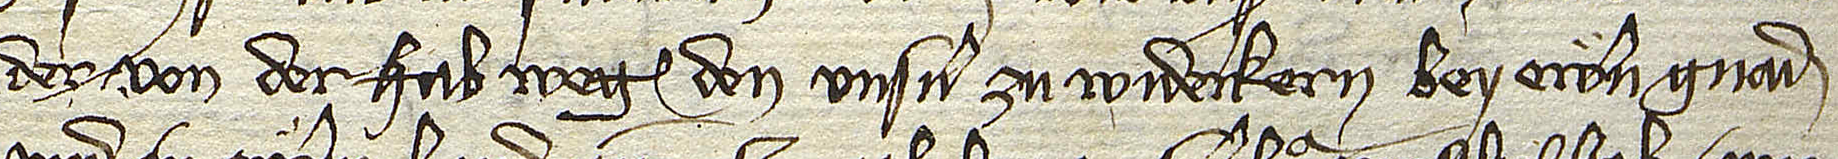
der von der hab weg* den vnſn* ʒu widerkern bey eẅn* gnad*
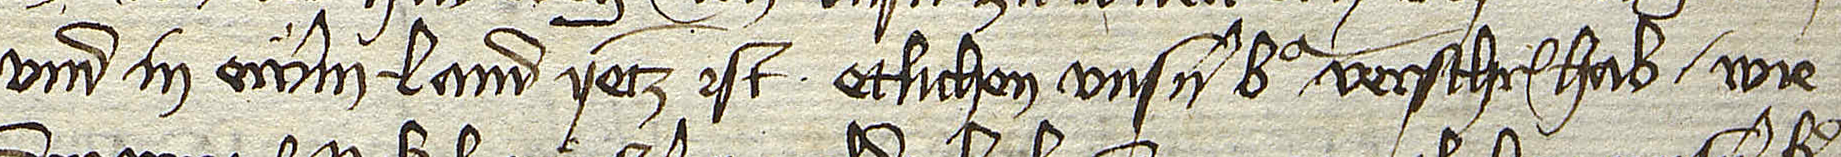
vnd in eẅm* land yecʒ* iſt . etlichen vnſn* b* verſchr* hab / wie
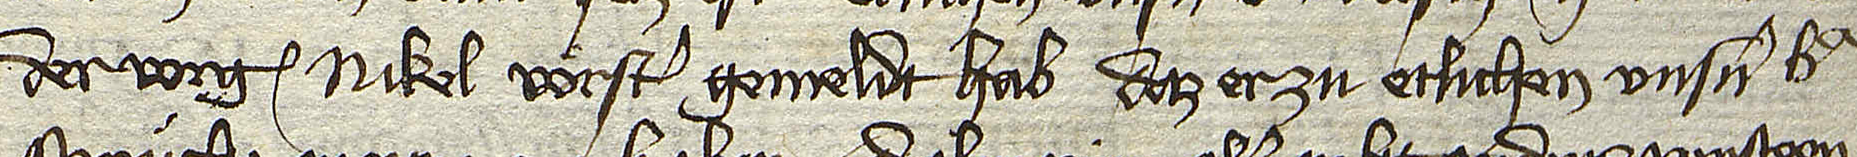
der vorg* Nikel vörſt* gemeldt hab daʒ er ʒu etlichen vnſn* b*
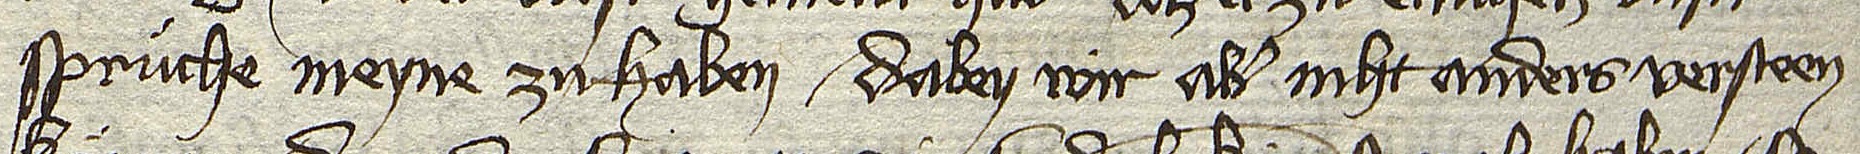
ſprüche meyne ʒu haben / dabey wir ab* niht anders verſteen
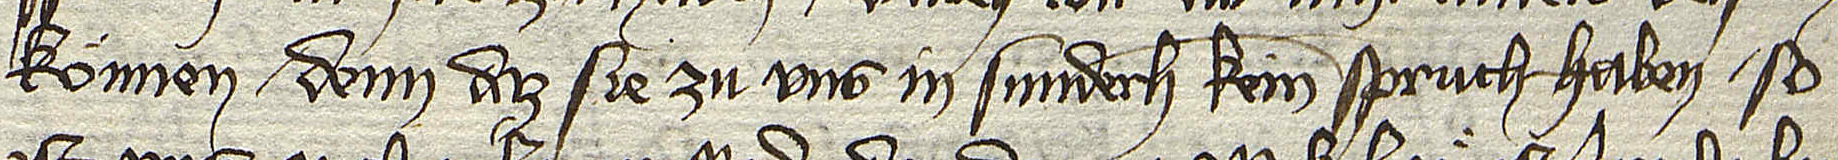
können / denn daʒ ſie ʒu vns in ſunderh* kein ſpruch haben / ſo
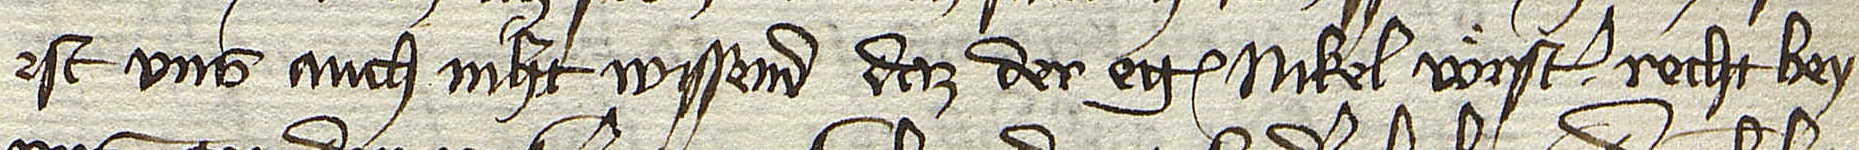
iſt vns auch niht wiſſend daʒ der eg* Nikel vörſt* recht bey
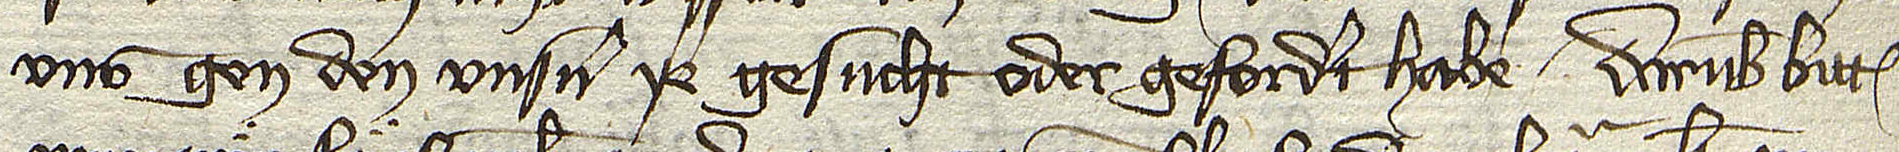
vns gen den vnſn* ye geſucht oder gefordt* habe / Darub* bitt*
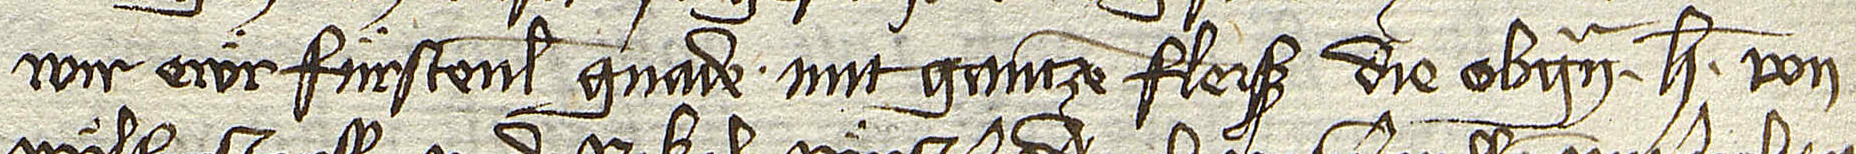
wir eẅr fürſtenl* gnade . mit gancʒe* fleiſʒ die obgn* . h* . von
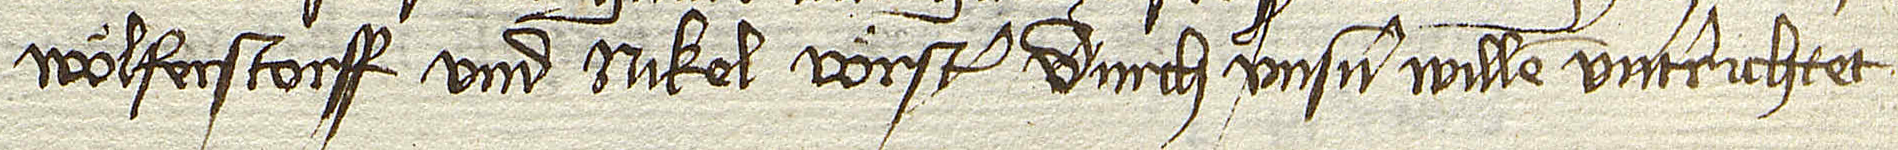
wölferſtorff vnd Nikel vörſt* durch vnſn* wille* vnt*richtet
